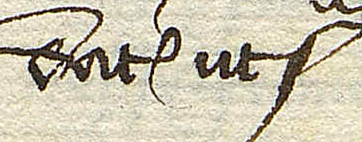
Dat* ut ſ*
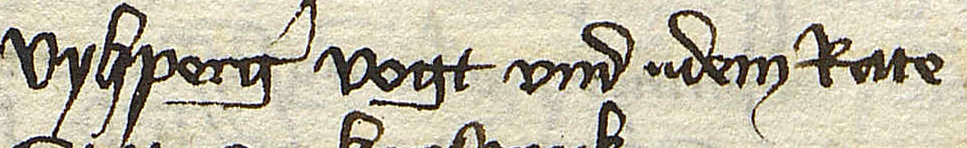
Vyhperg* vogt vnd ~ dem Rate
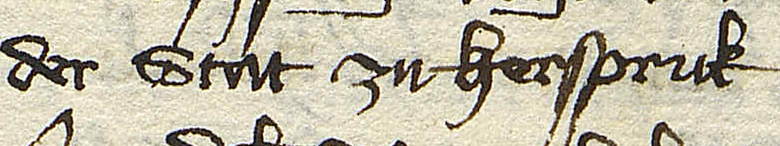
der Stat ʒu Herſpruk
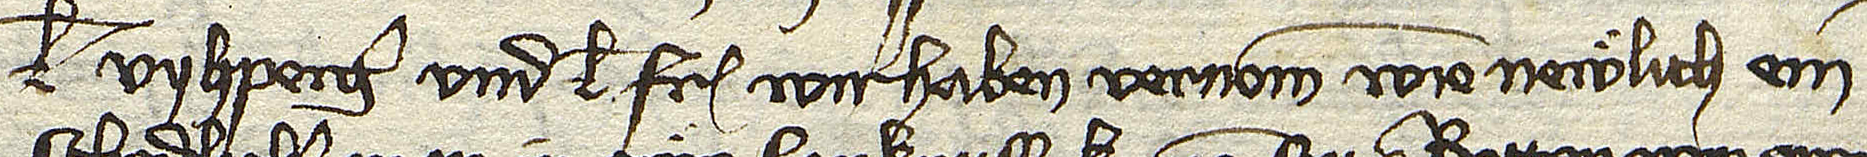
L* vyhperg* vnd L* fr* wir haben vernom* wie newlich ein
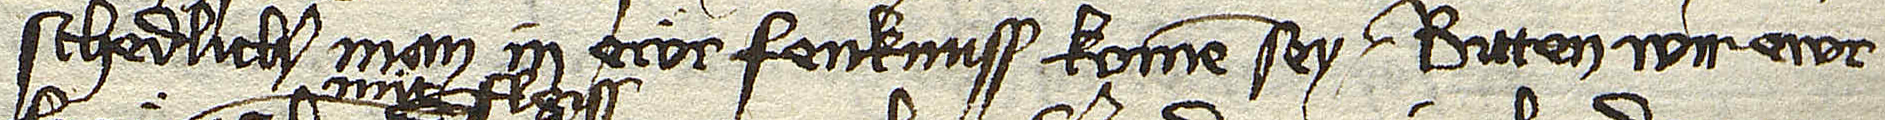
ſchedlich* man in ewr fenknuſſ kome* ſey / Bitten wir ewr
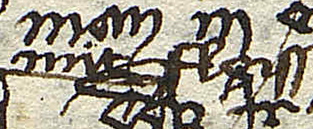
mit fleiſſ
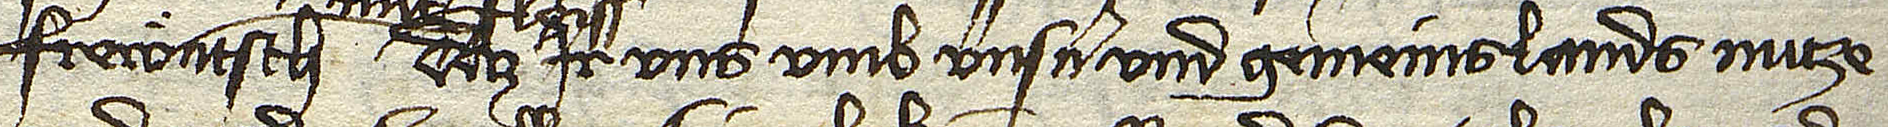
frewntſch* daʒ Ir vns vmb vnſ n* vnd gemeins lands nucʒe
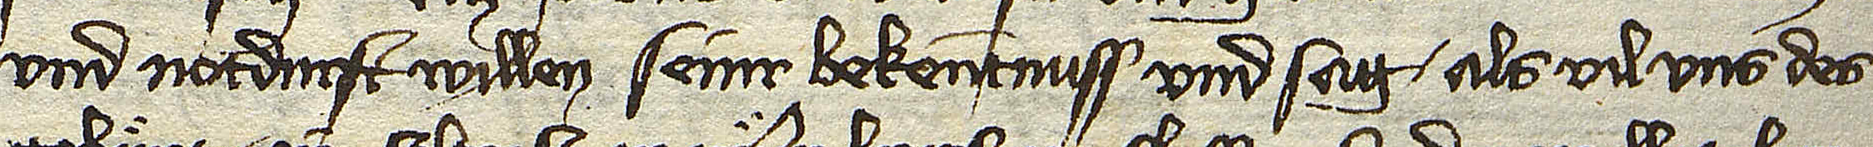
vnd notdurft willen ſeinr bekentnuſſ* vnd ſag / als vil vns des
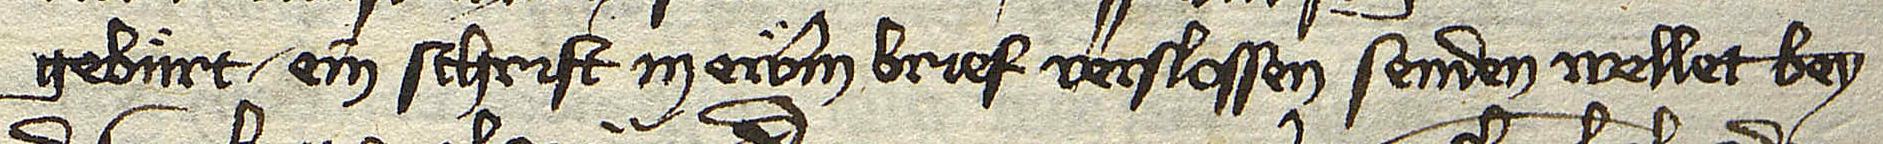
gebürt / ein ſchrift in ew*m brief verſloſſen ſenden wellet bey
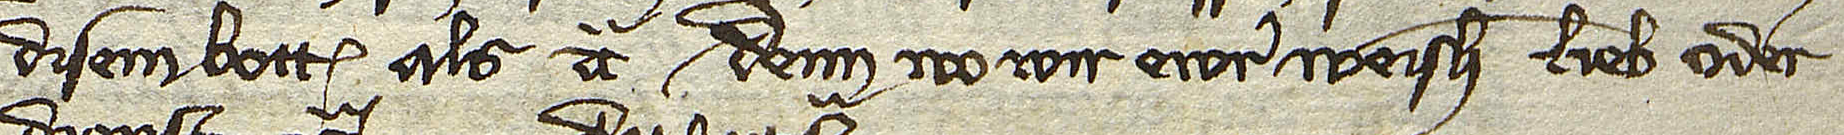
diſem bott* als ec* / Denn wo wir ewr* weiſh* lieb oder
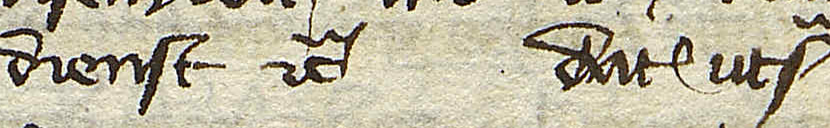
dienſt ec* dat* ut ſ*
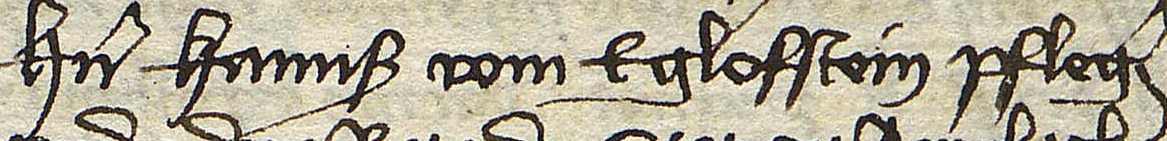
Hn* Hannſ* vom Eglofſtein pfleg*
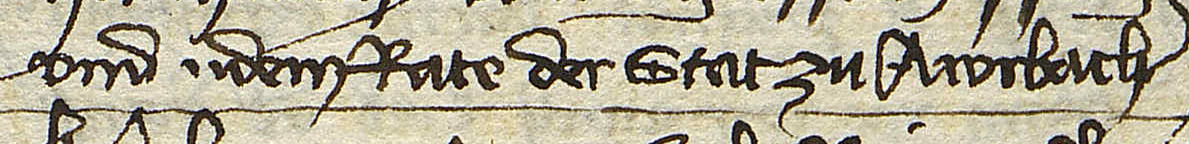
vnd ~ dem Rate der Stat ʒu Awrbach
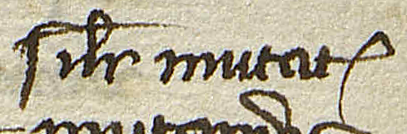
ſilr* mutat*
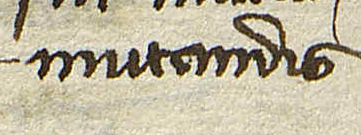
mutandis
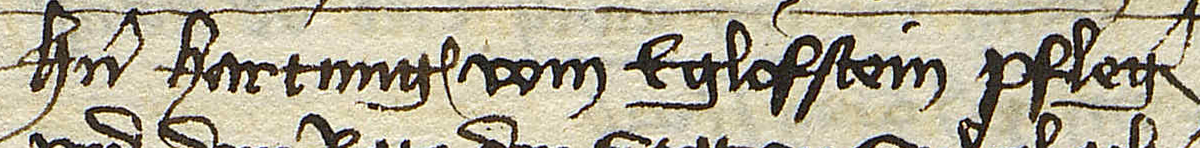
Hn* Hartung* vom Eglofſtein pfleg*
